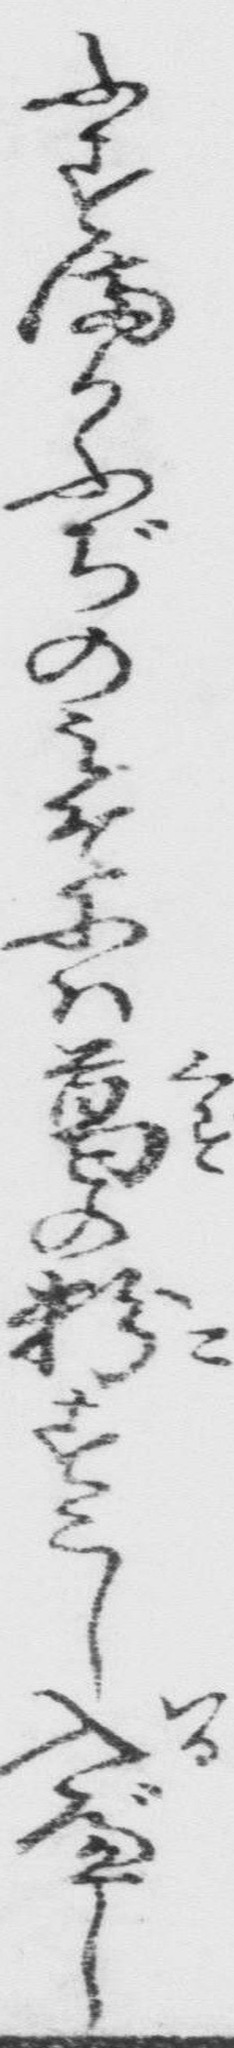ふすまりふぢのみそには葛の粉すこし入べし
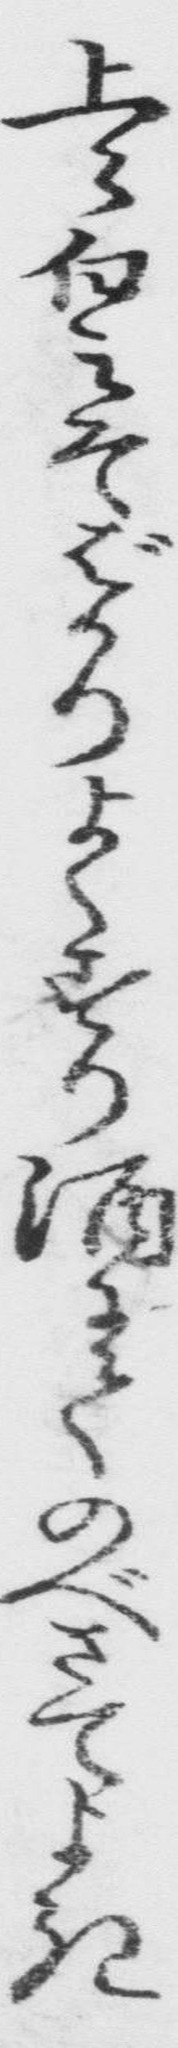上々白みそばかりよくすり酒にてのべさてよき
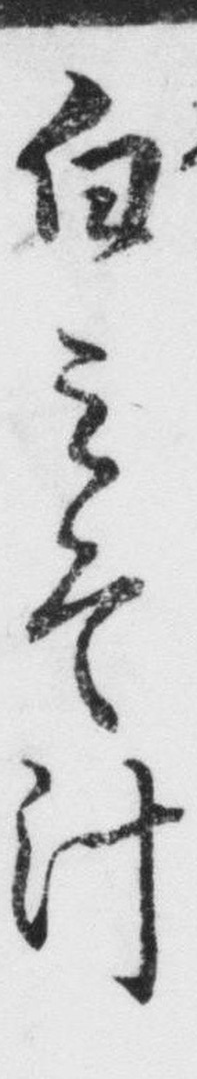白みそ汁
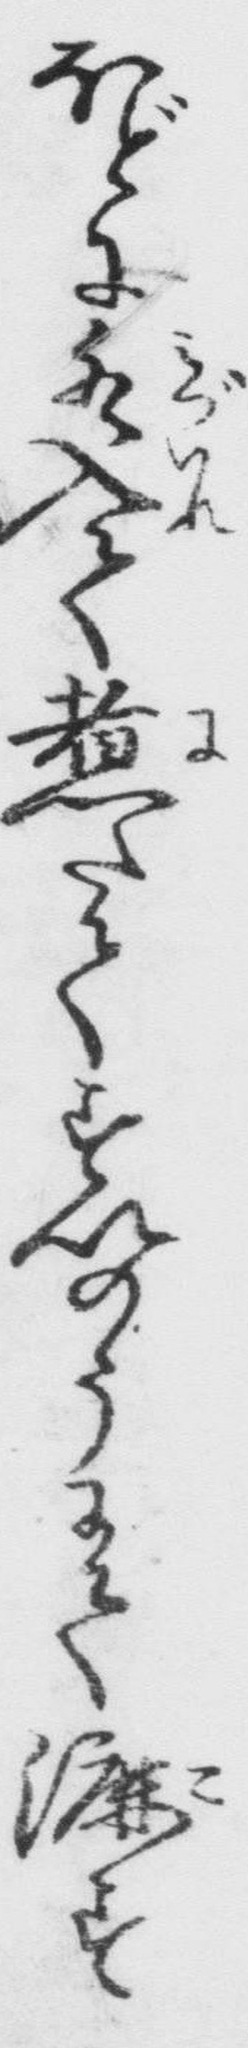ほどに水入て煮たてすいのうにて濾す
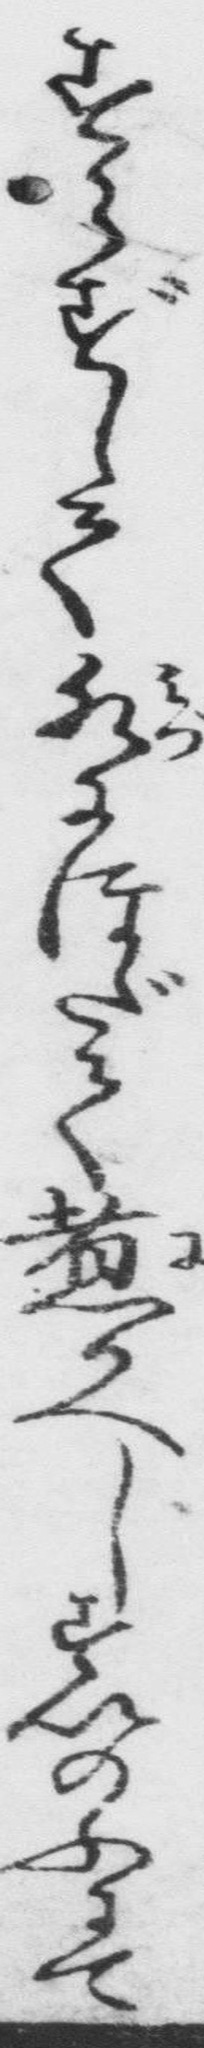すらずして水にほだて煮かへしすいのふにて
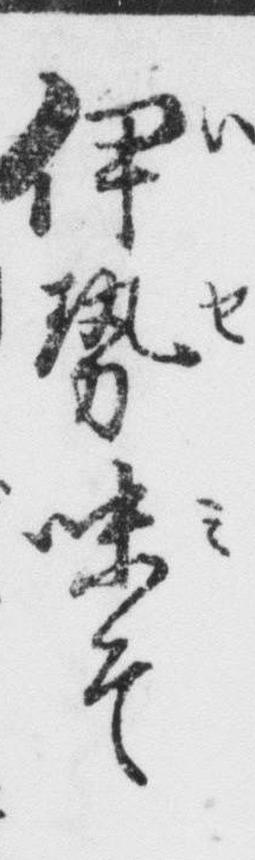伊勢味そ
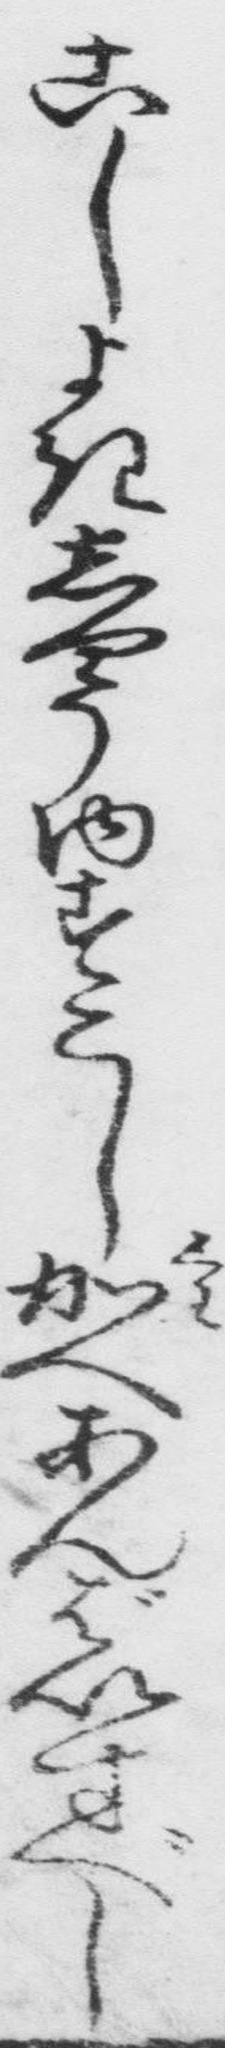こしよきしやうゆすこし加へあんばいすべし

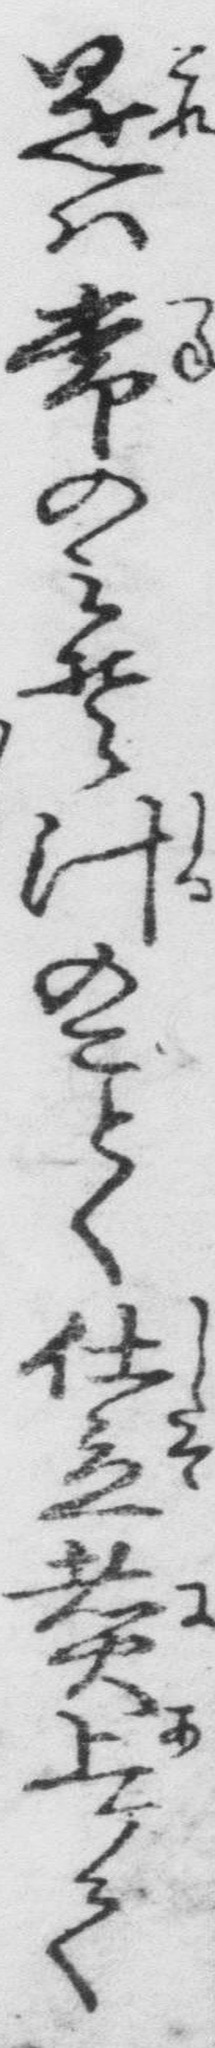是は常のみそ汁のごとく仕立煮上げけて
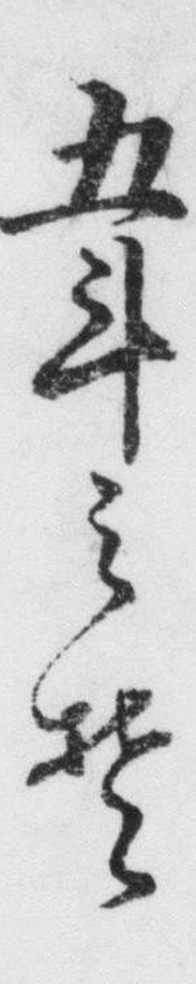五斗みそ
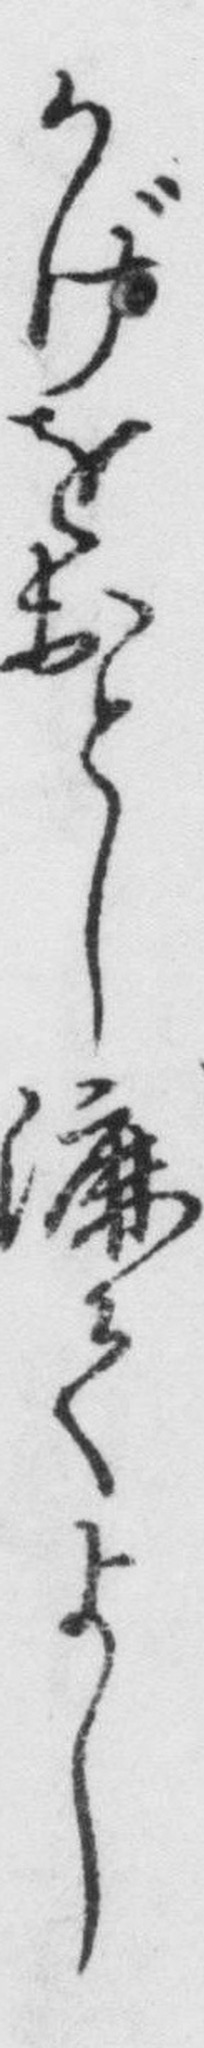かげをおとし濾てよし
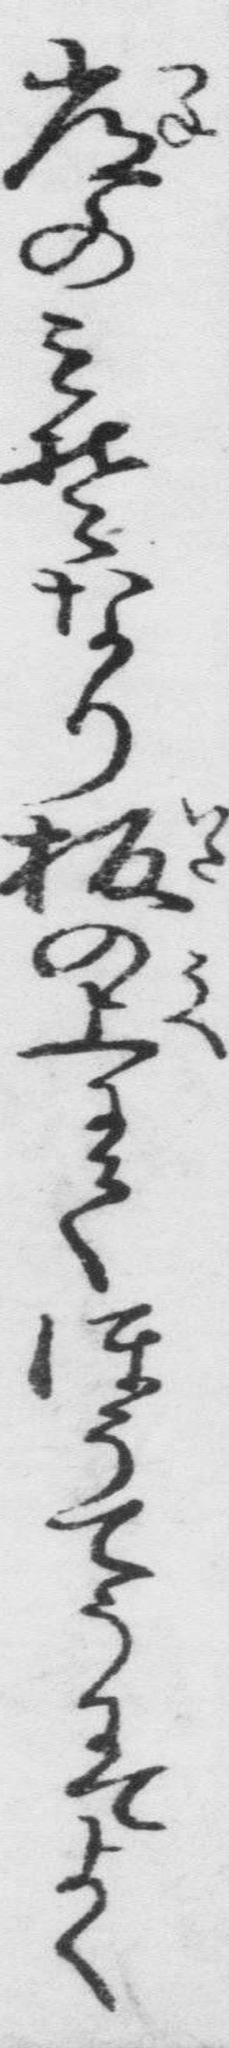常のみそなり板の上にてほうてうにてよく
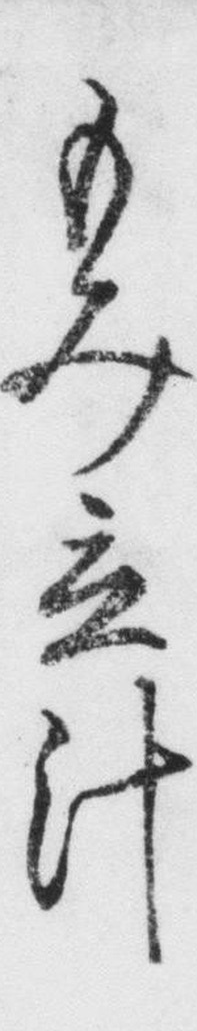もみ立汁
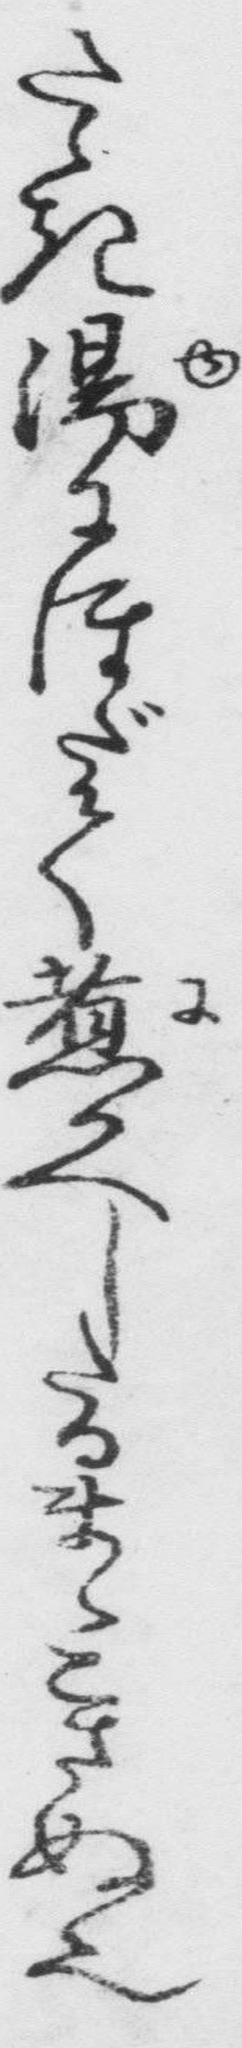たゝき湯にほだて煮かへしたるまゝこさぬ也
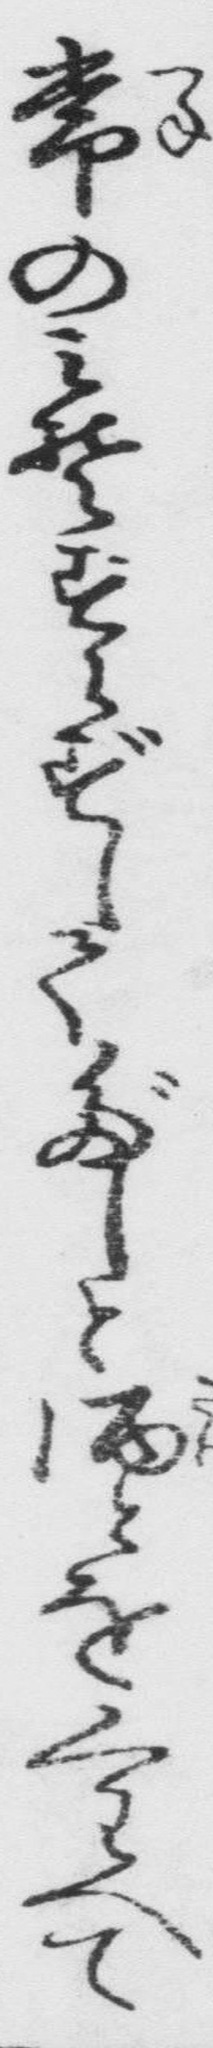常のみそすらずしてだしと酒とをくわへて
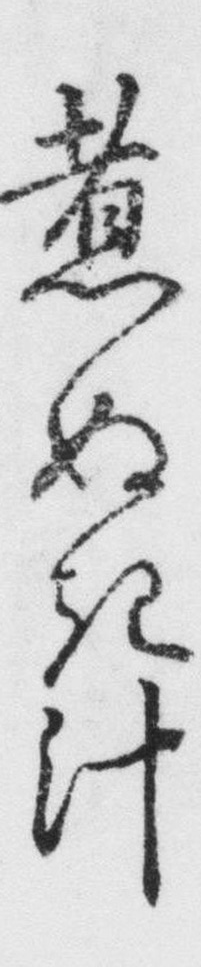煮ぬき汁
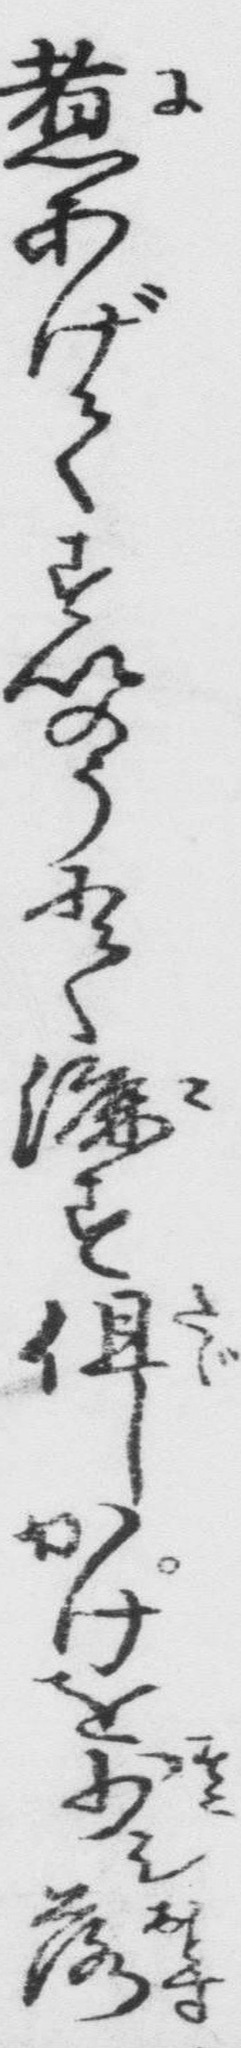煮あげてすいのうにて漉す但しかげを少し落
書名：料理早指南
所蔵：大阪府立大学学術情報センター 国文学研究資料館
